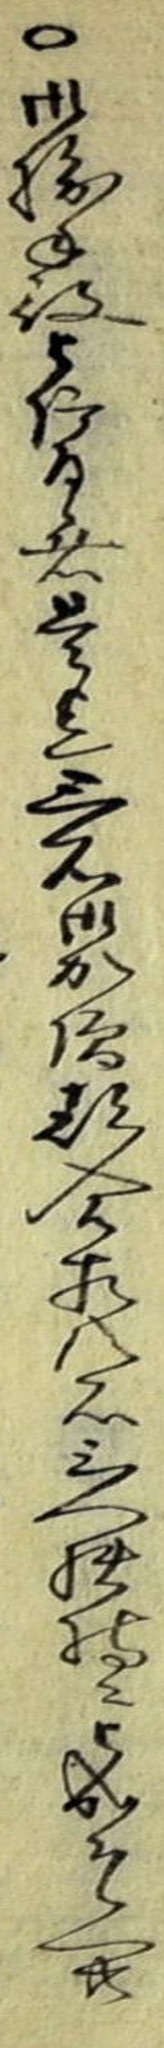○御勝手役被仰付者是迄三石御加増都合拾八石三人扶持に被成下候へ共
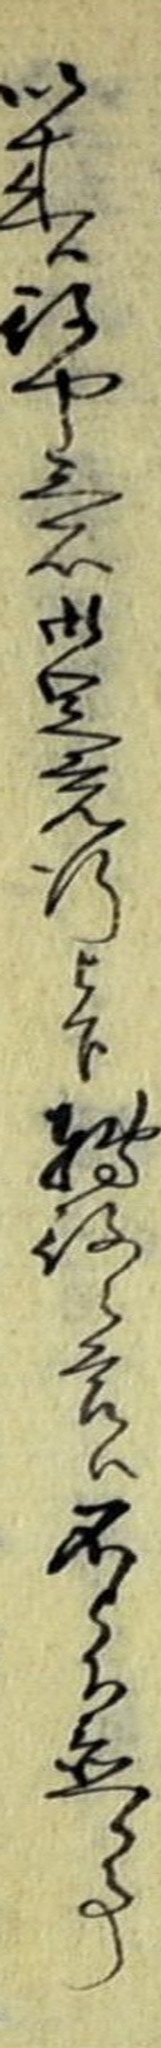以来は役中三石御足充行被下転役之節は不被下置候事
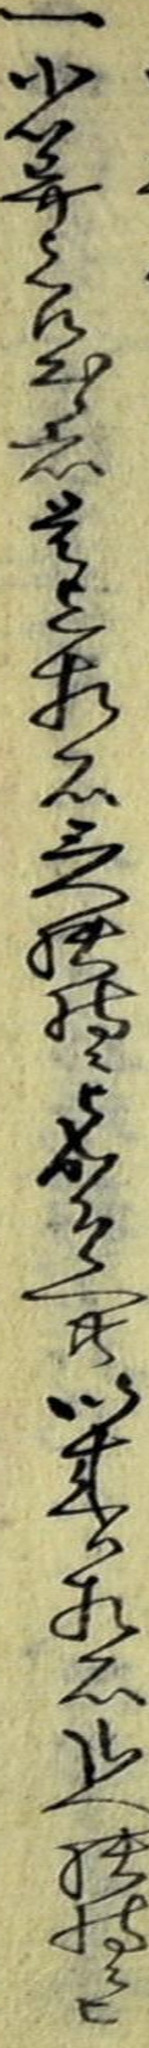一小算被召出候者是迄拾石三人扶持に被成下候へ共以来は拾石弐人扶持に被
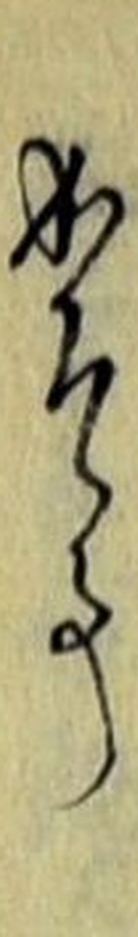成下候事

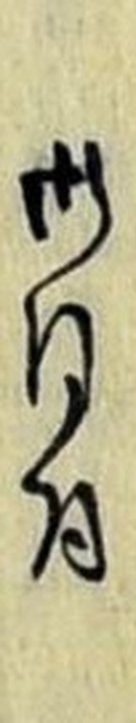御目付
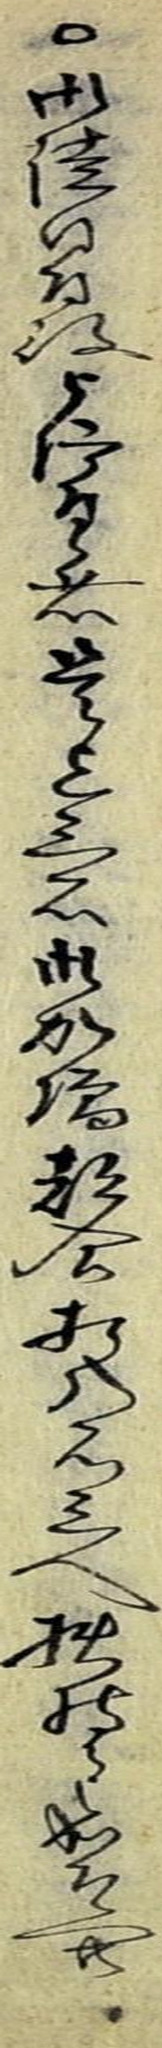○御徒目付役被仰付候者是迄三石御加増都合拾八石三人扶持に被成下候へ共
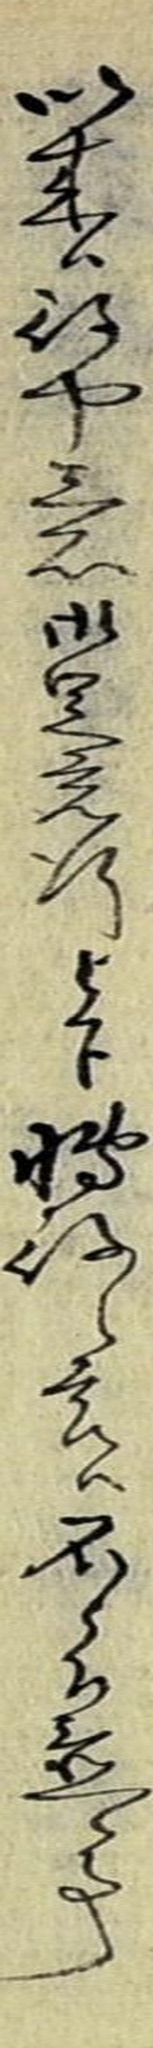以来は役中三石御足充行被下転役之節は不被下置候事
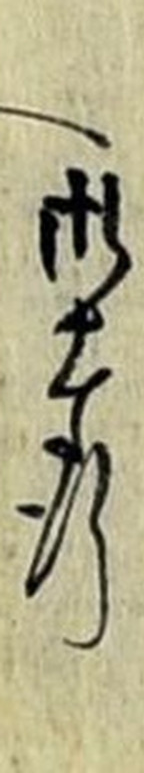御奉行
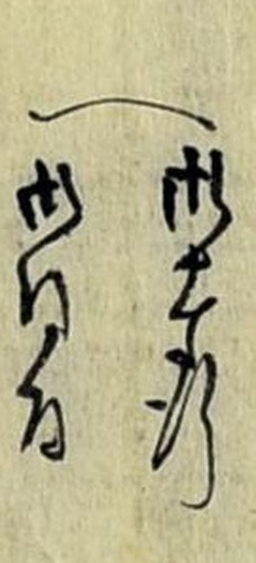御目付
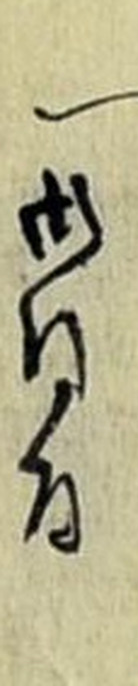御目付
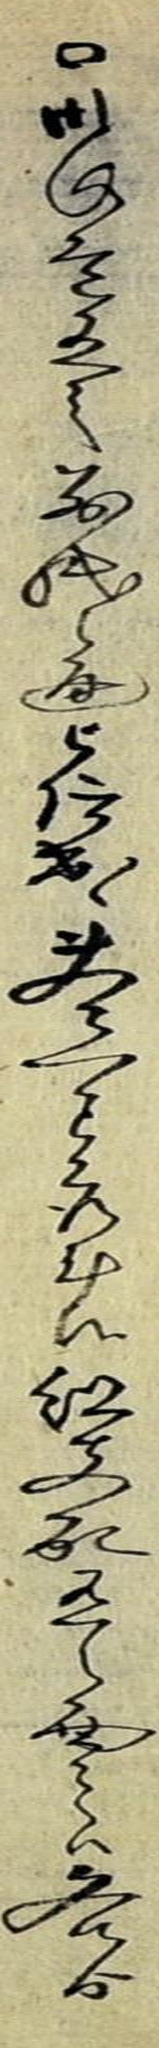○御趣意有之別紙之通被仰出候夫々可被取斗候組支配有之面々は各ゟ
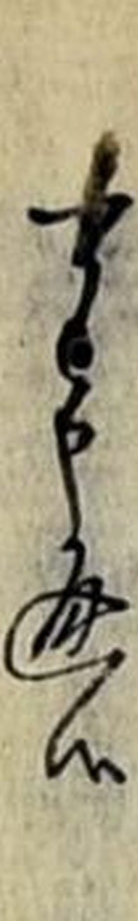可被申通候
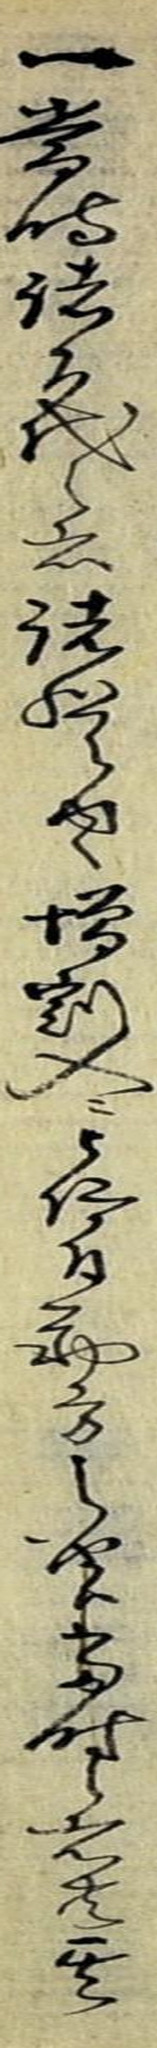一当時諸下代之者諸組之内へ増割入に被仰付勤方之儀は当時之者共其
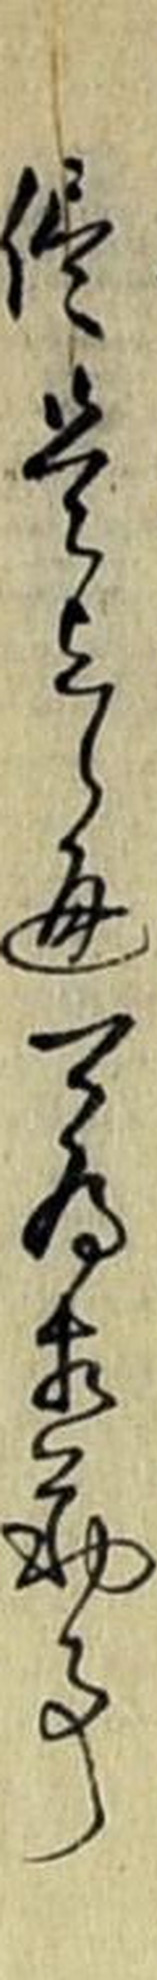侭是迄之通可為相勤事
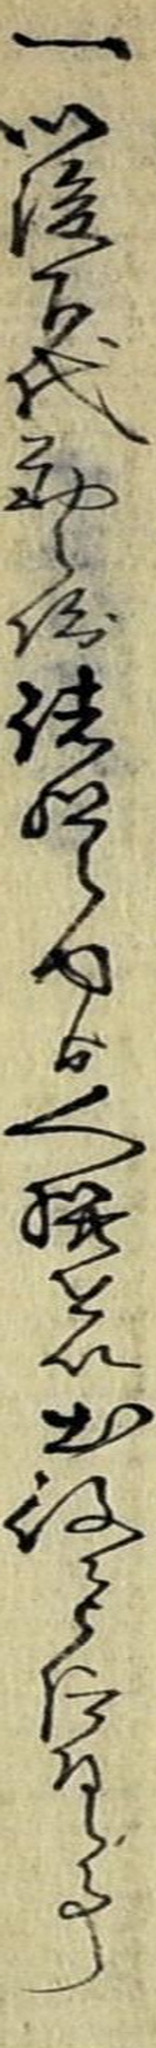一以後下代勤之儀諸組之内ゟ人選を以出役被仰付候事
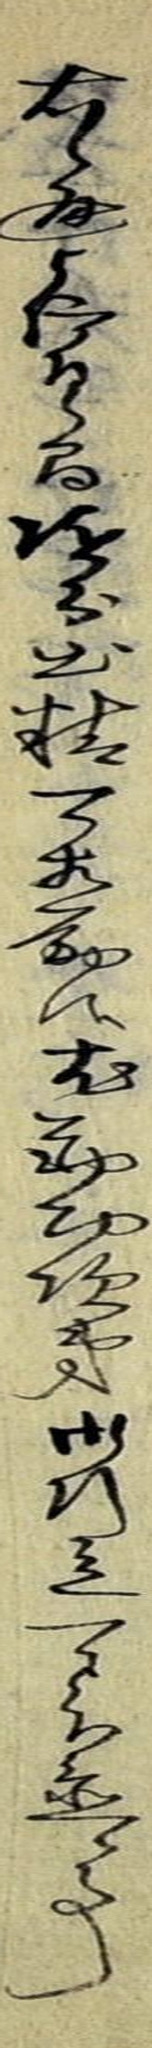右之通被仰付候間随分出精可相勤候右勤功次第御引立可被下置候事
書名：命令之部 四
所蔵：福井県文書館 Fukui Prefectural Archives
